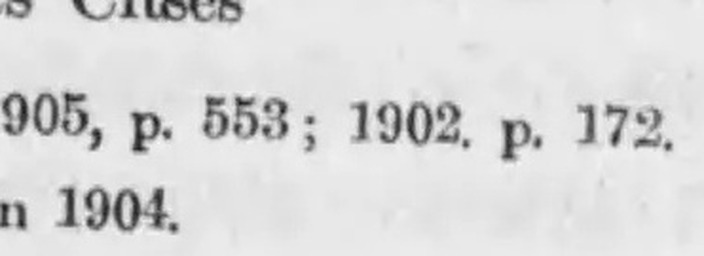,,,,,,;,,,,,
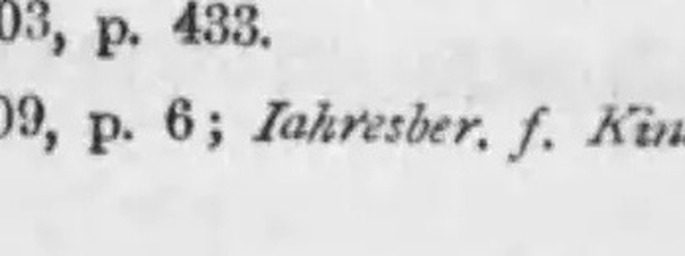,,,,,,;,,,,,
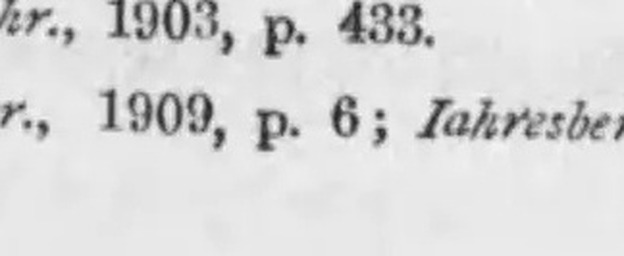,,,,,,;,,,,,
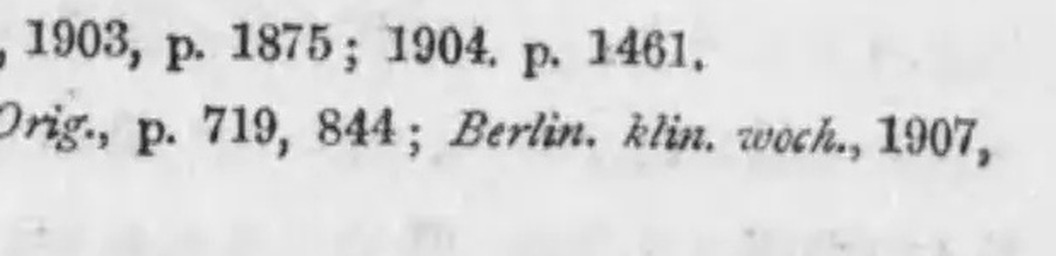,,,,,,;,,,,,
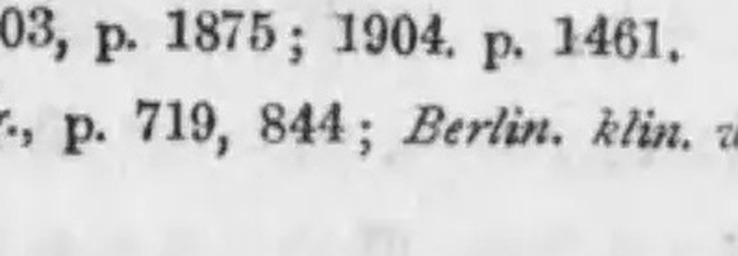,’,,,;,,,
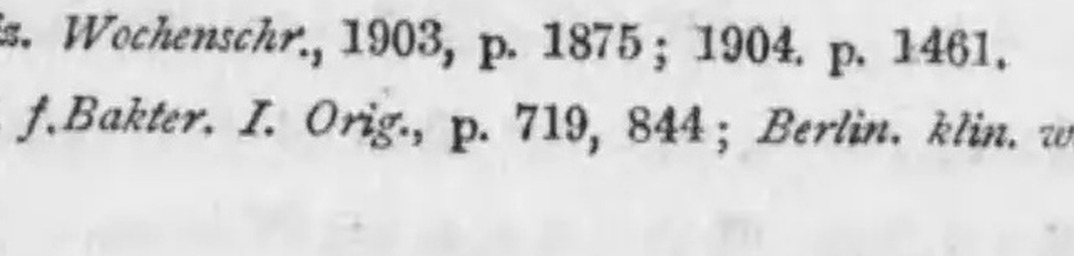,,,,,,;,,,,,
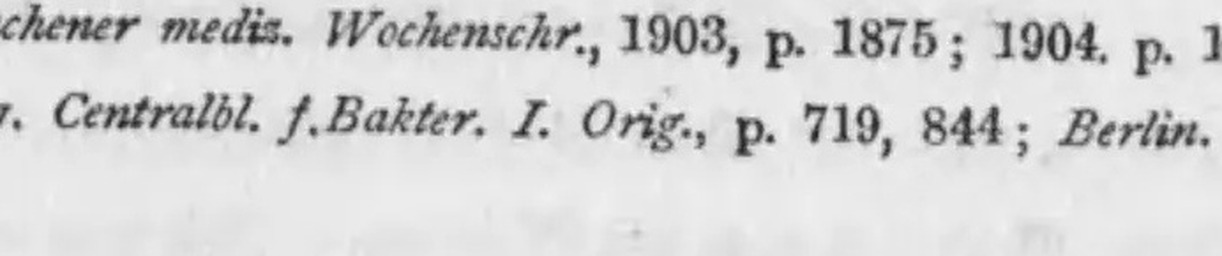,,,,,,;,,,,,

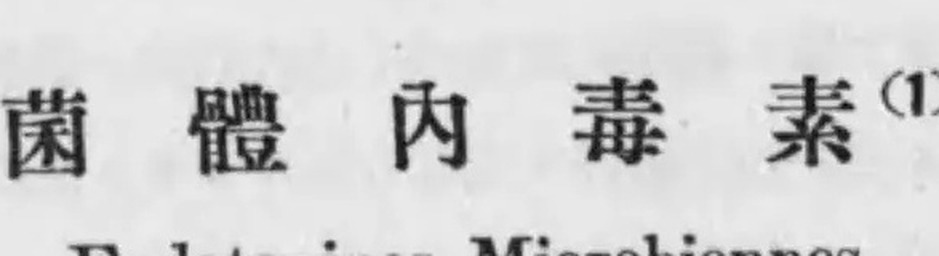菌体内毒素()

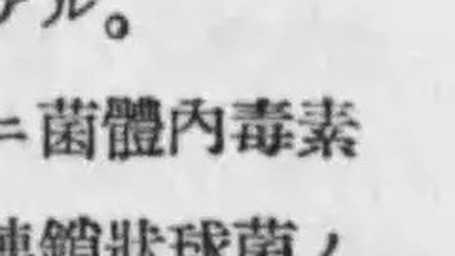菌体内毒素

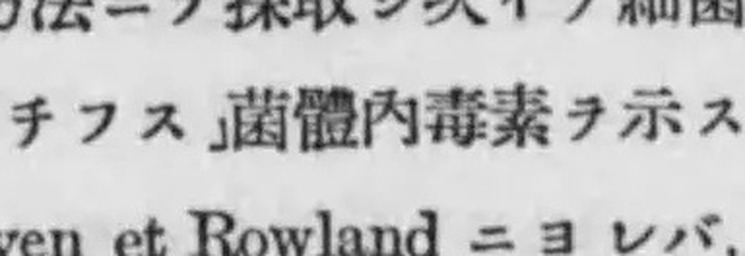「チフス」菌体内毒素
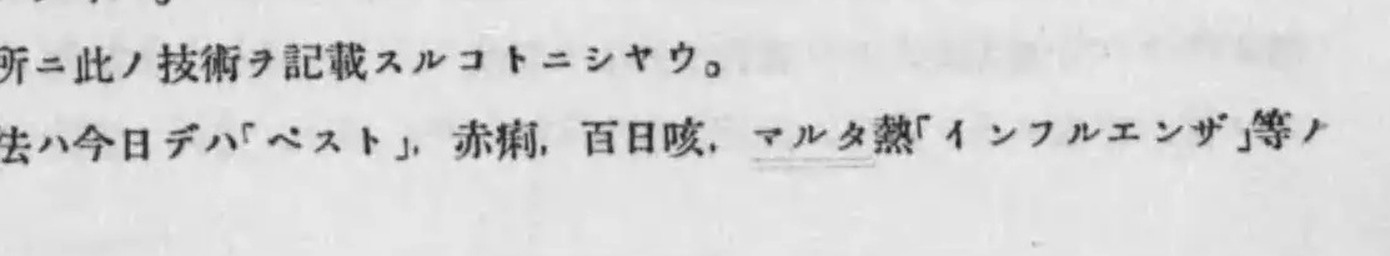本法は今日では「ペスト」、赤痢、百日咳、マルタ熱「インフルエンザ」等の
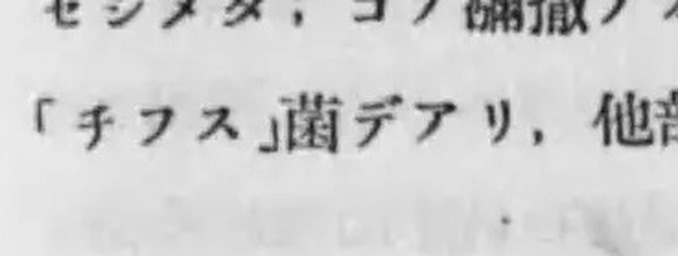「チフス」菌体内毒素
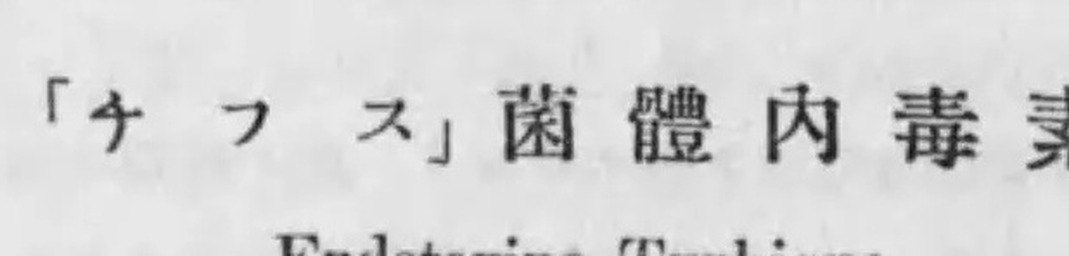「チフス」菌体内毒素
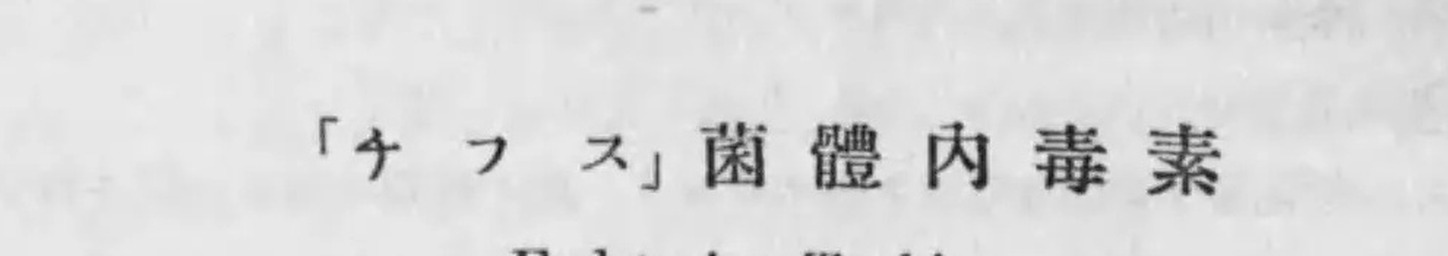「チフス」菌体内毒素
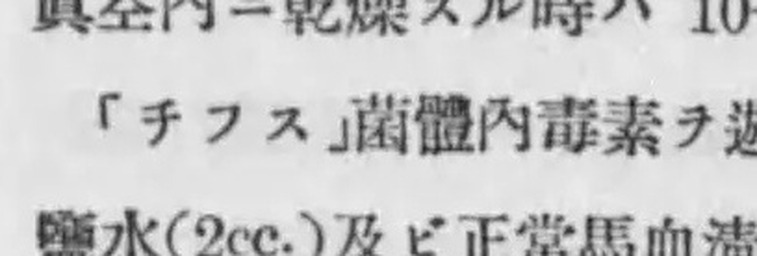「チフス」菌体内毒素

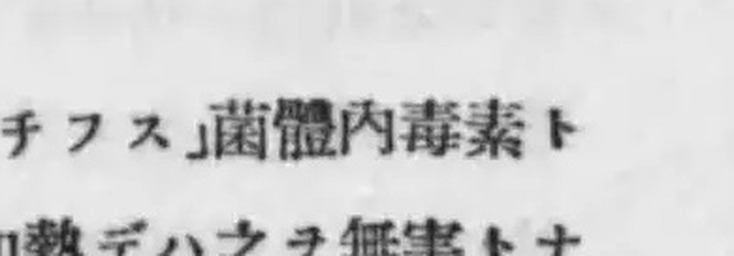「チフス」菌体内毒素
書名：伝染病ニ於ケル免疫ニ関スル研究
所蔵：国立国会図書館 National Diet Library, JAPAN
